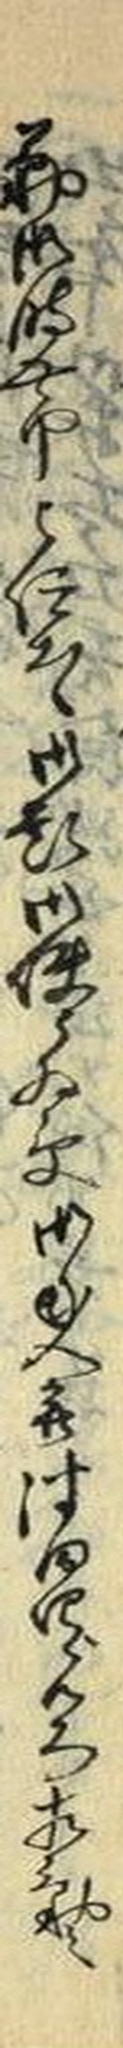勤御時節被仰出候御歓御使被為受御用人幷津田四郎左衛門相勤之
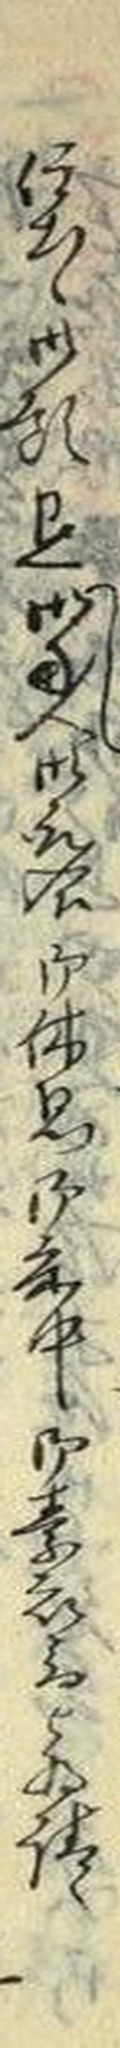仰出候御歓申上御用人御取合御休息御床中御素衣ニ而被為請候
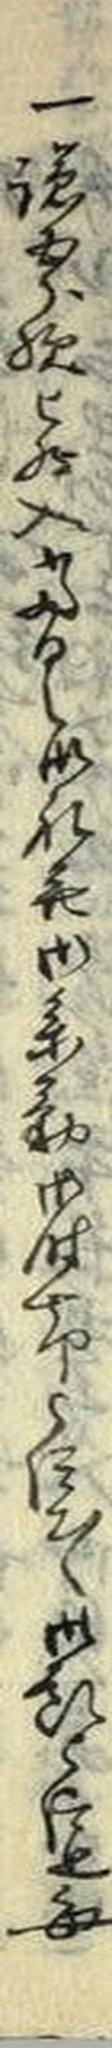一謙五郎様被為入当日之御礼幷御参勤御時節被仰出候御歓被仰上毎
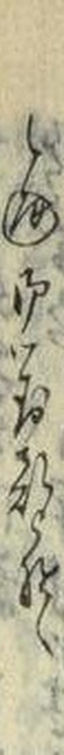之通御対顔被遊候
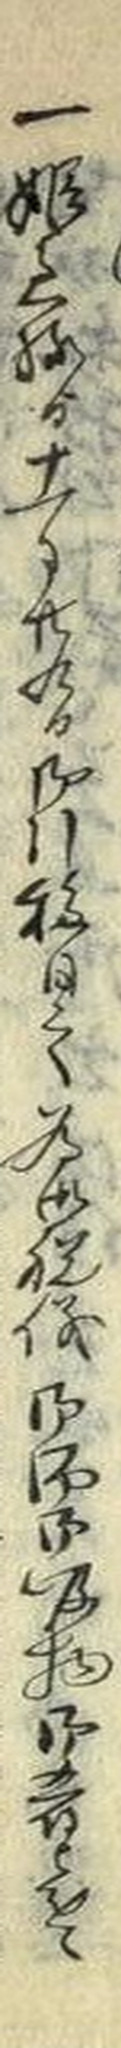一姫君様ゟ十一月廿九日御引移日之為御祝儀御酒御吸物御肴被進候
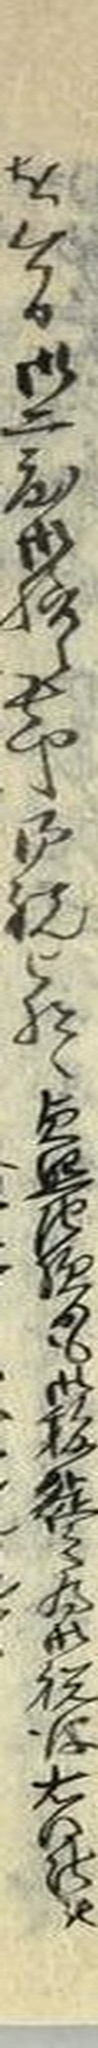を今日御二度御膳之節御祝被遊候貞照院様ゟも御移徒之為御祝儀右同断被
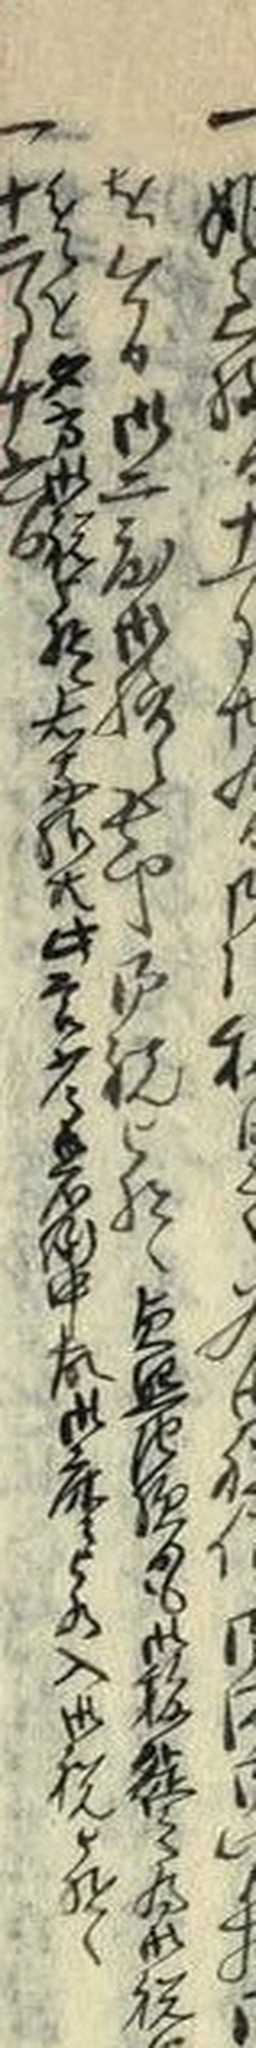進候を夕方御祝被遊候右両様共此節少々御不例中故御床ニ被為入御祝被遊候
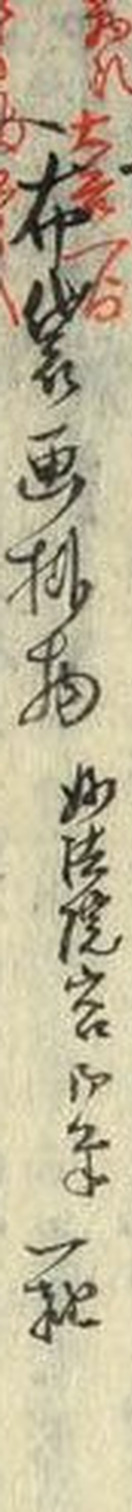布袋画掛物妙法院宮御筆一軸
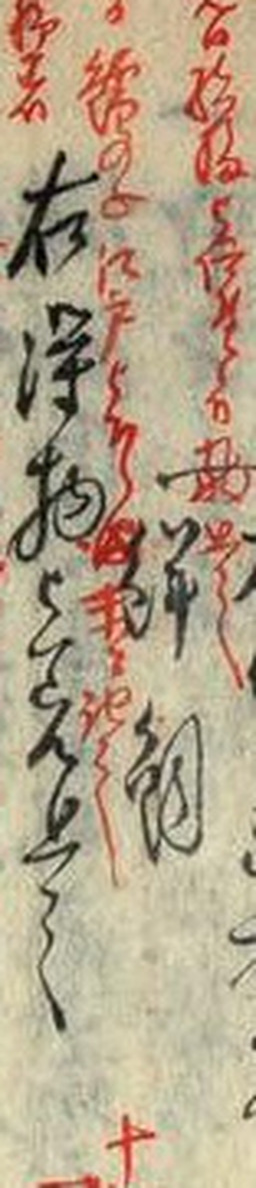右得物被差上之

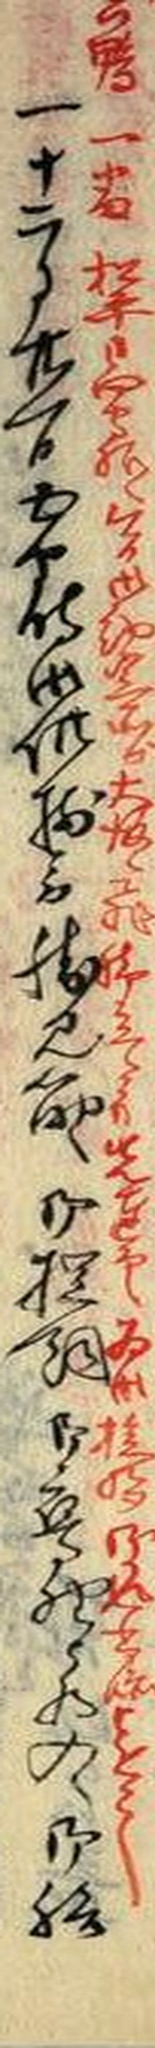一十二月廿一日五半時御供揃ニ而勝見筋へ御捉飼御鷹野被為入候御膳
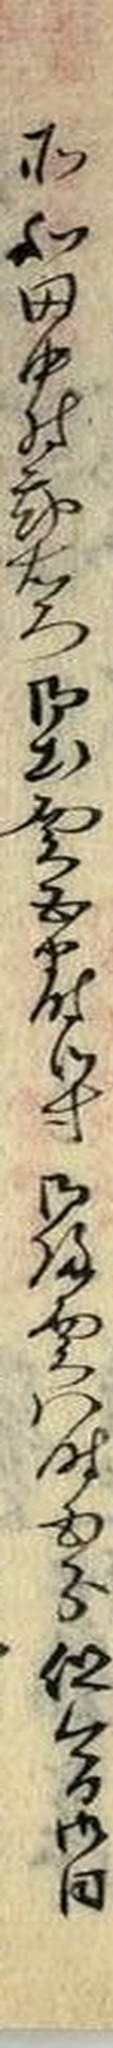所和田中村勘右衛門御出殿五半時弐寸御帰殿八時五分但今日御日
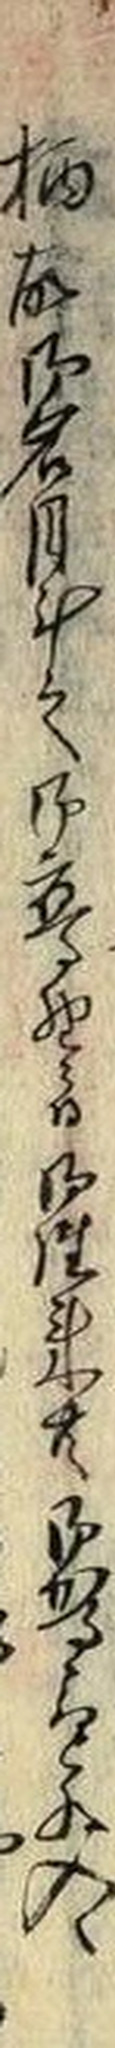柄故御名目斗之御鷹野ニ而御往来共御駕ニ而被為入候
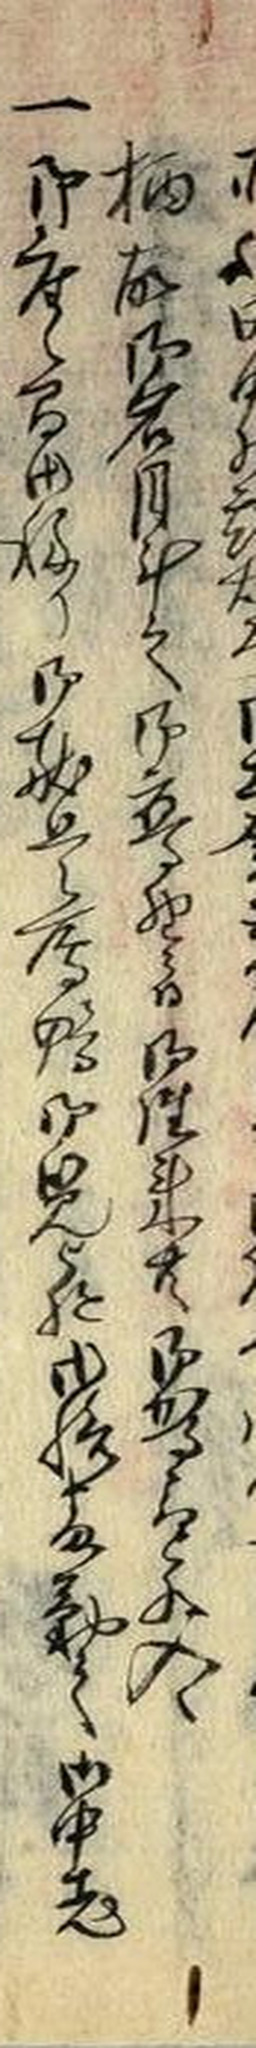一御座之間御移り御献上之鳫鴨御覧被遊御膳番勤之御中老
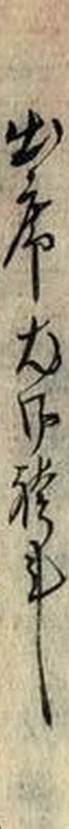出席尤御袴斗
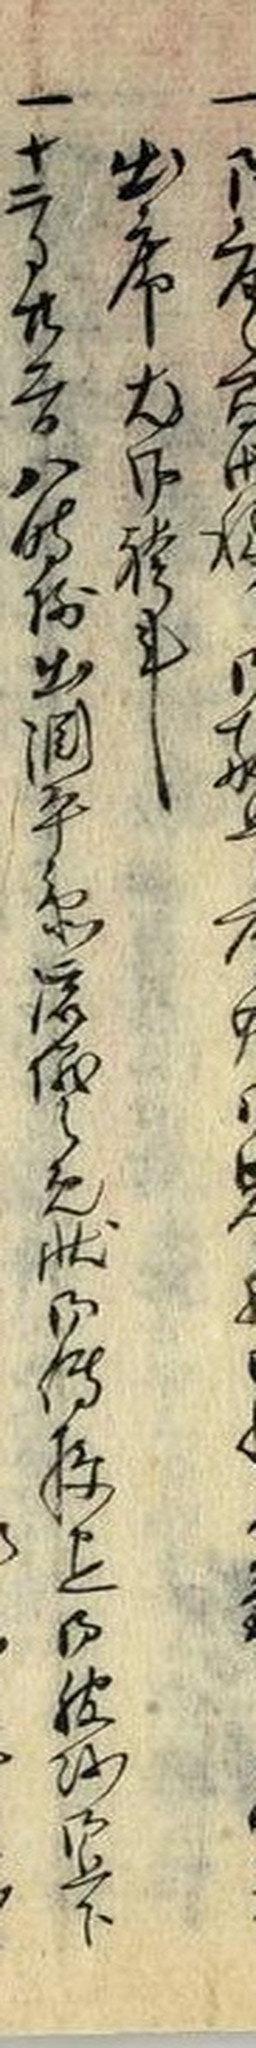一十二月廿二日八時揃出淵平兵衛流儀之免状御伝授申上御服紗御上下
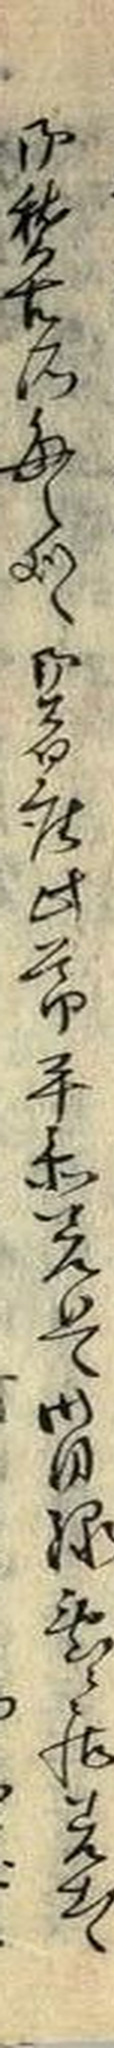御稽古所毎之処へ御着座此節平兵衛差上候御目録台ニ居差出候
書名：少傅日録抄（斉承付側向頭取日記、在国）
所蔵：福井県文書館 Fukui Prefectural Archives
